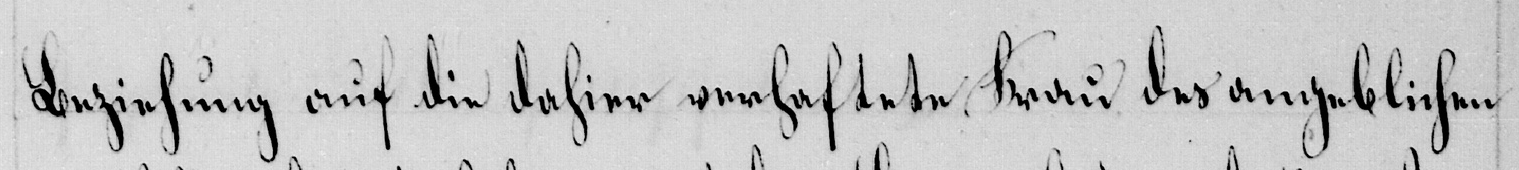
Beziehung auf die dahier verhaftete Frau des angeblichen
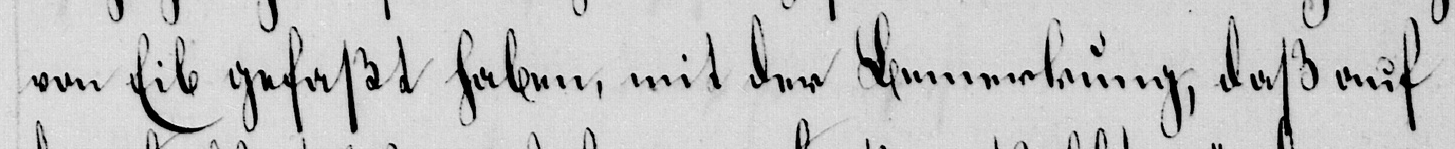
von Eib gefaßt haben, mit der Bemerkung, daß auf
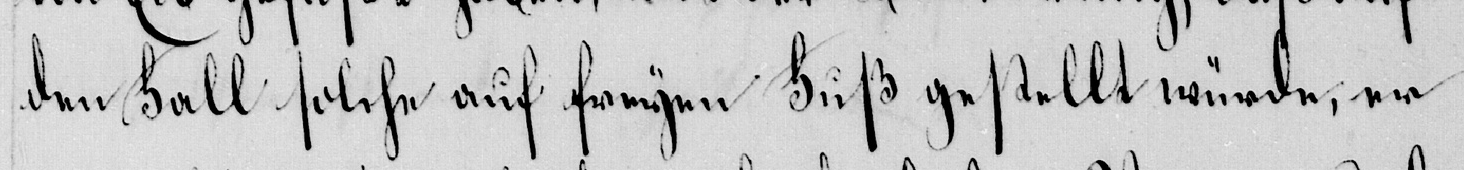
den Fall solche auf freyen Fuß gestellt würde, er
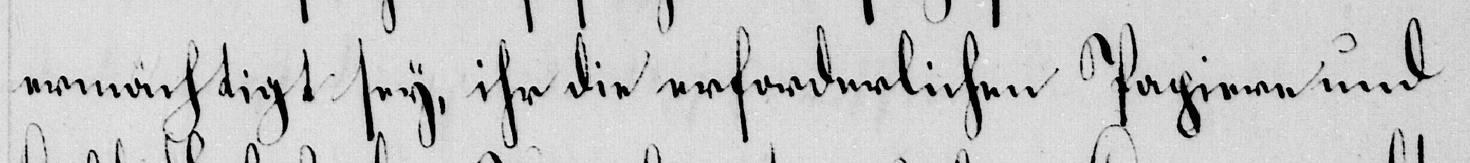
ermächtigt sey, ihr die erforderlichen Papiere und
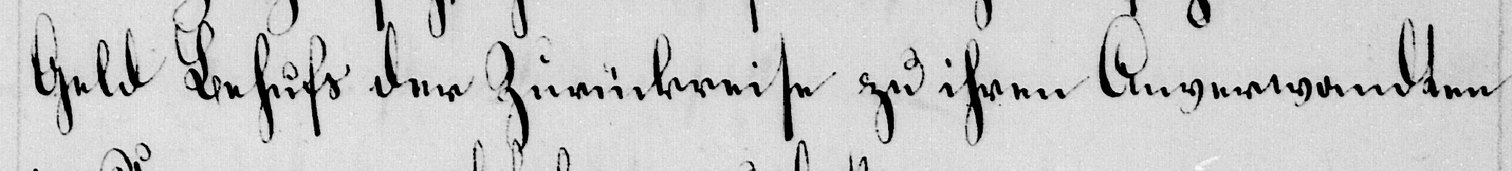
Geld Behufs der Zurückreise zu ihren Anverwandten
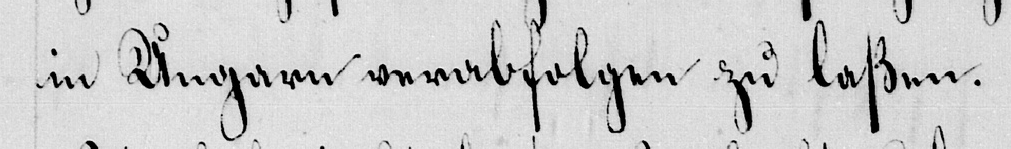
in Ungarn verabfolgen zu laßen.
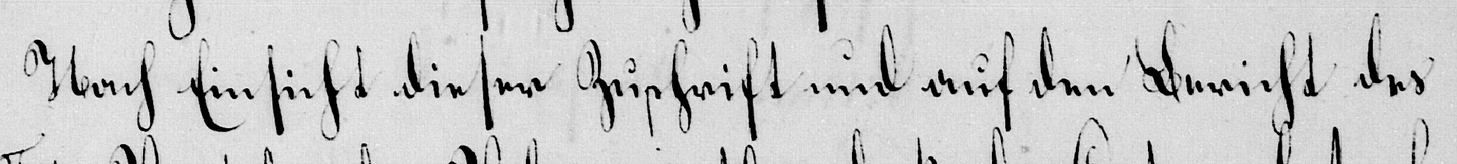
Nach Einsicht dieser Zuschrift und auf den Bericht des
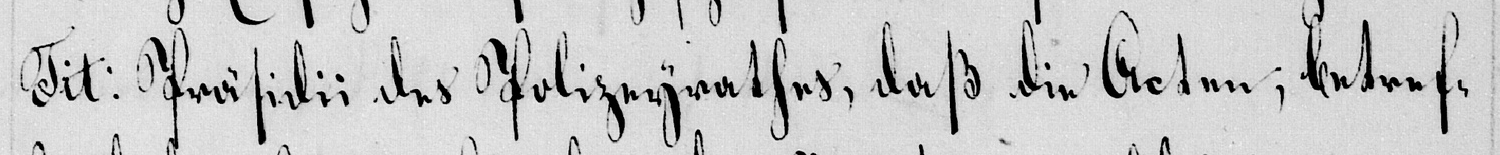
Tit: Präsidii des Polizeyrathes, daß die Acten, betref¬
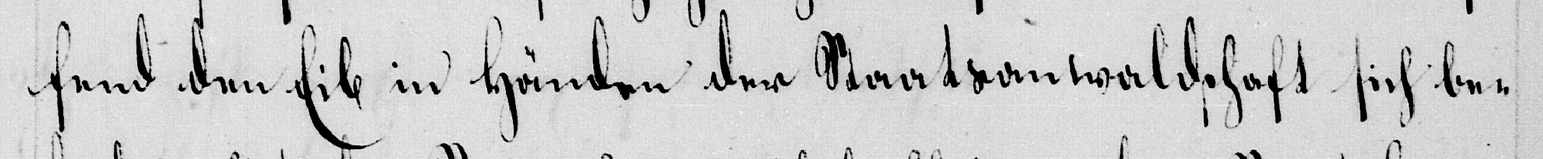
fend den Eib in Händen der Staatsanwaldschaft sich be¬
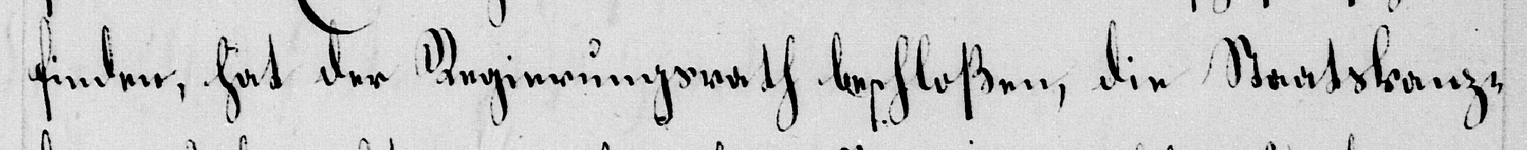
finden, hat der Regierungsrath beschloßen, die Staatskanz¬
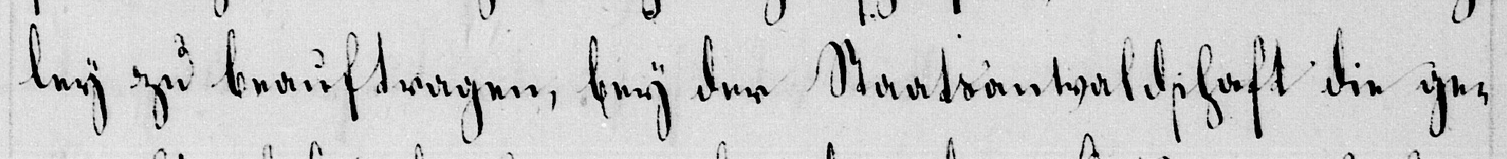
ley zu beauftragen, bey der Staatsanwaldschaft die ge¬
